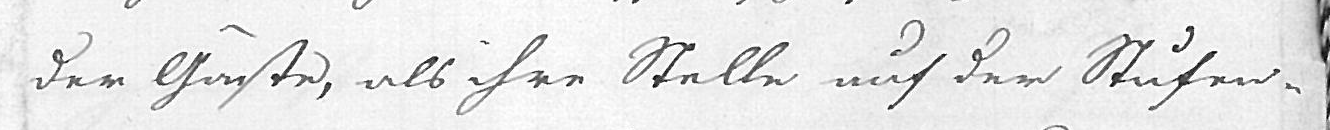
der Gäste, als ihre Stelle auf der Stufen-
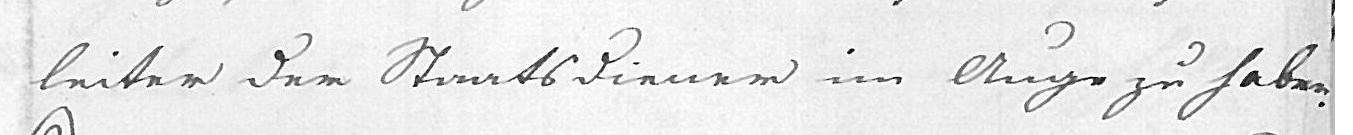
leiter der Staatsdiener im Auge zu haben.
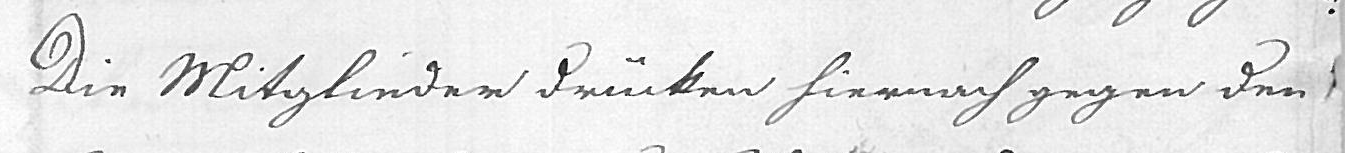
Die Mitglieder drücken hiernach gegen den
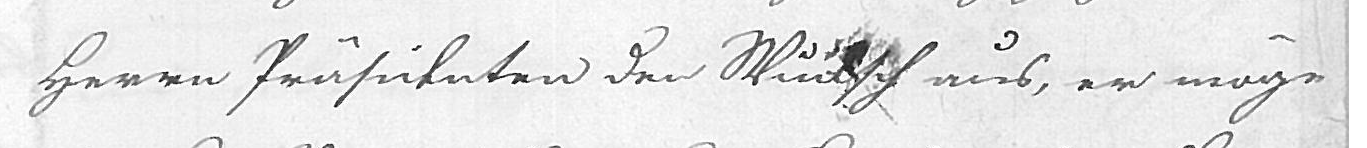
Herrn Präsidenten den Wunsch aus, er möge
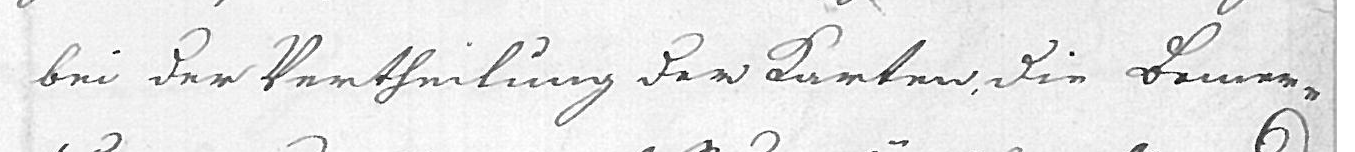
bei der Vertheilung der Karten die Bemer-
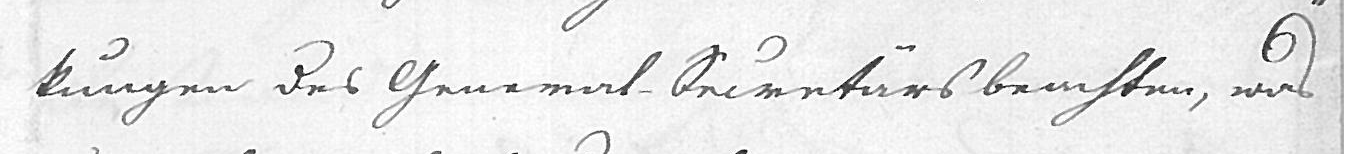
kungen des General-Secretärs beachten, was
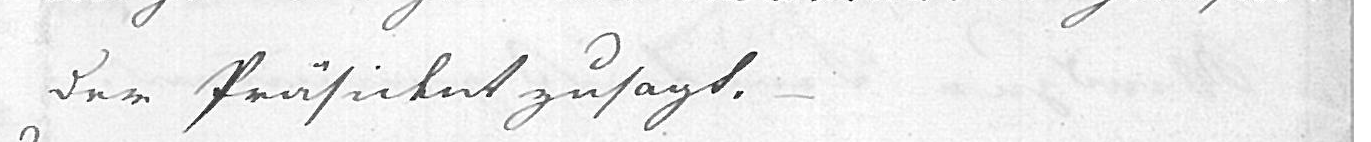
der Präsident zusagt.
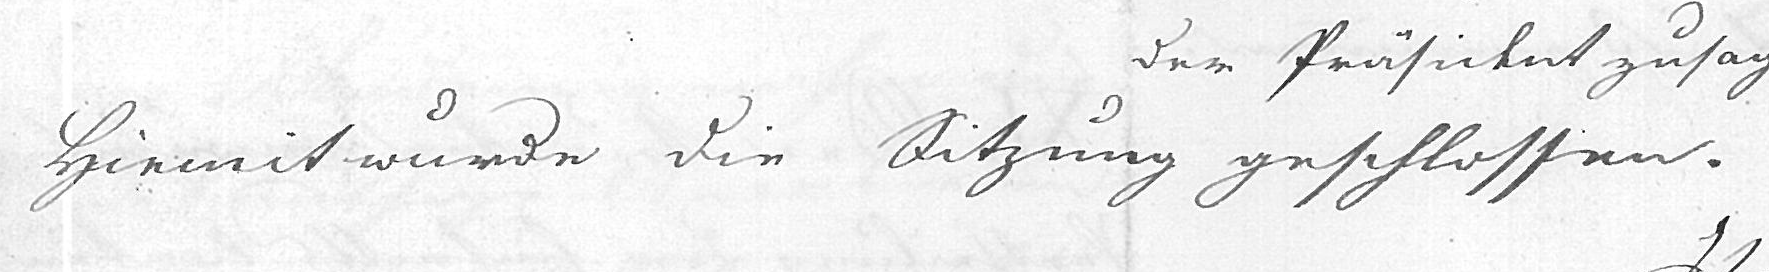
Hiemit wurde die Sitzung geschlossen.
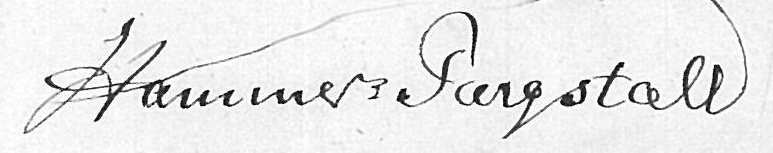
Hammer-Purgstall
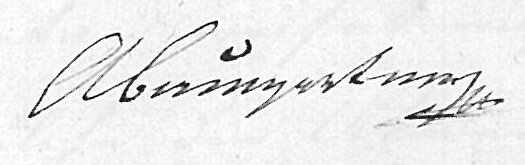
ABaumgartner
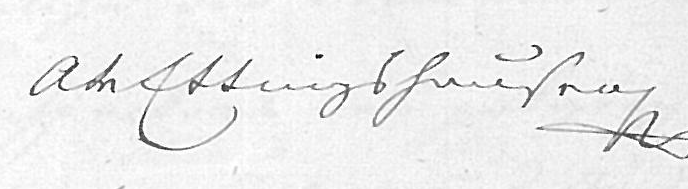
AvEttingshausen
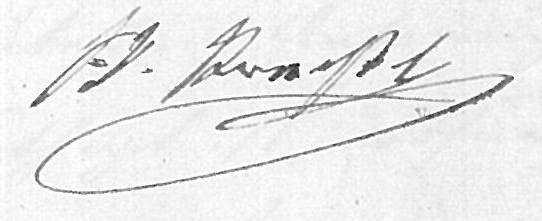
J.J. Prechtl
